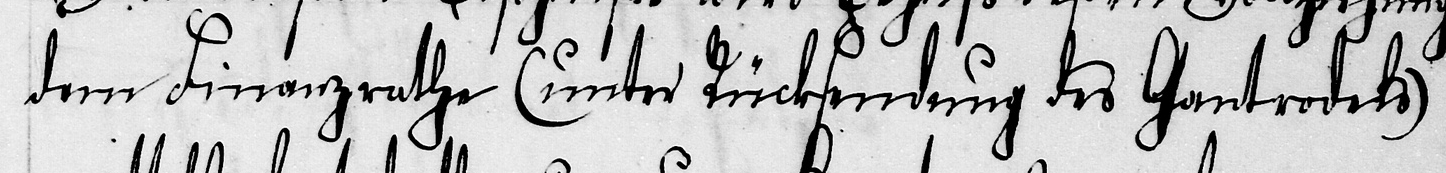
dem Finanzrathe (unter Rücksendung des Gantrodels)
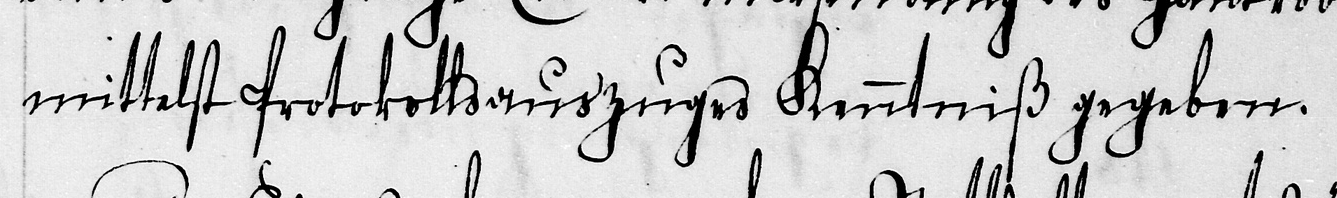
mittelst Protokollsauszuges Kenntniß gegeben.
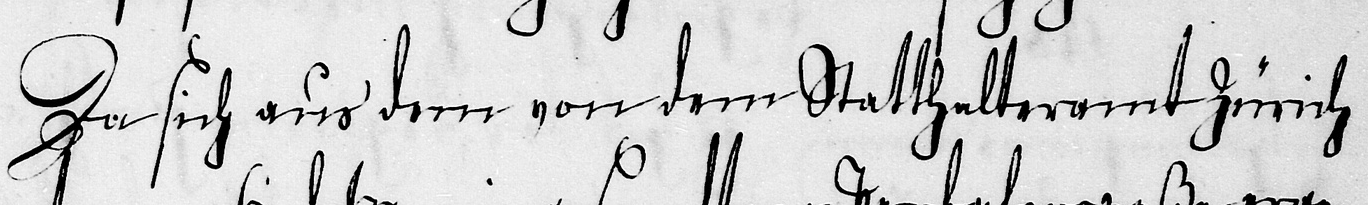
Da sich aus dem von dem Statthalteramt Zürich
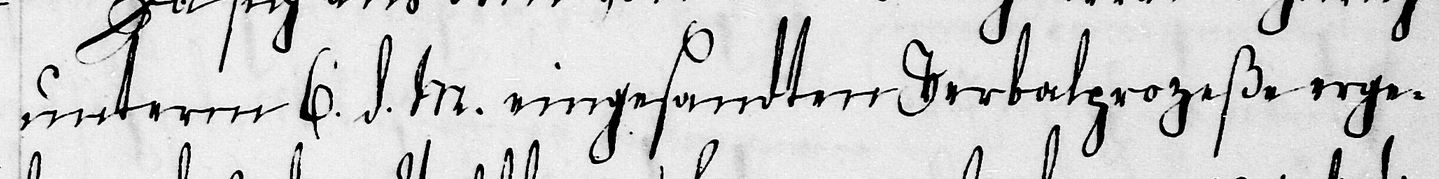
unterm 6. d. M. eingesandten Verbalprozeße erge¬
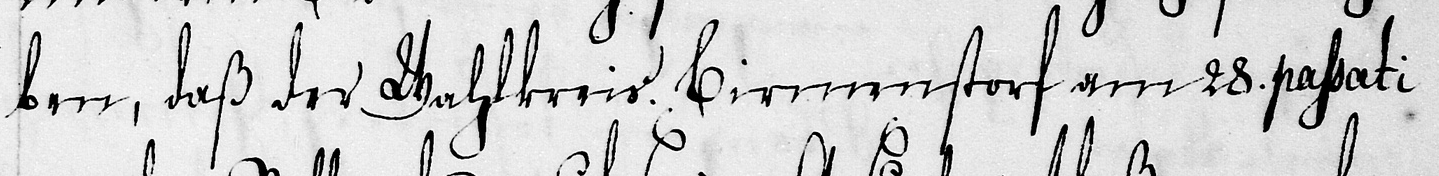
ben, daß der Wahlkreis Birmenstorf am 28. passati
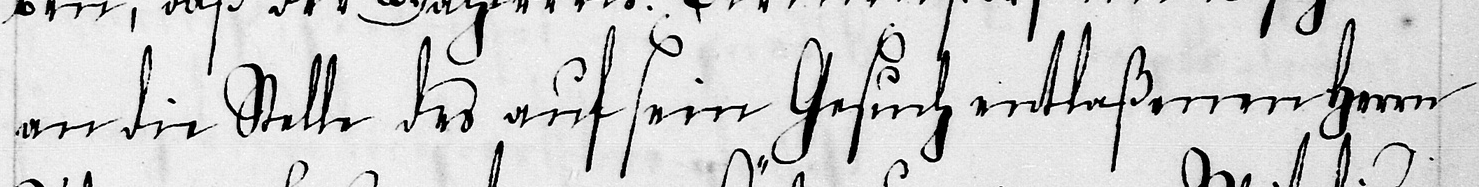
an die Stelle des auf sein Gesuch entlaßenen Herrn
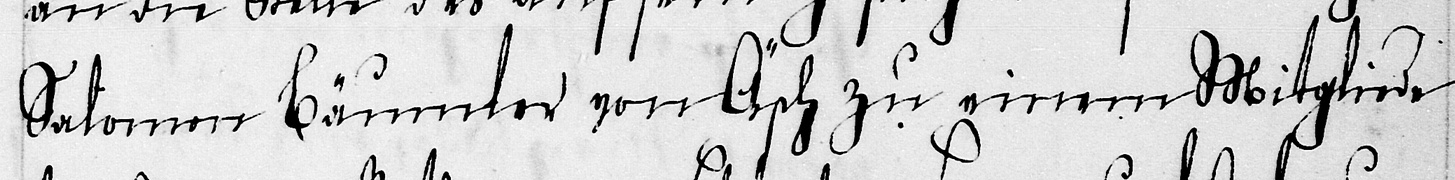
Salomon Bäumler von Äsch zu einem Mitgliede
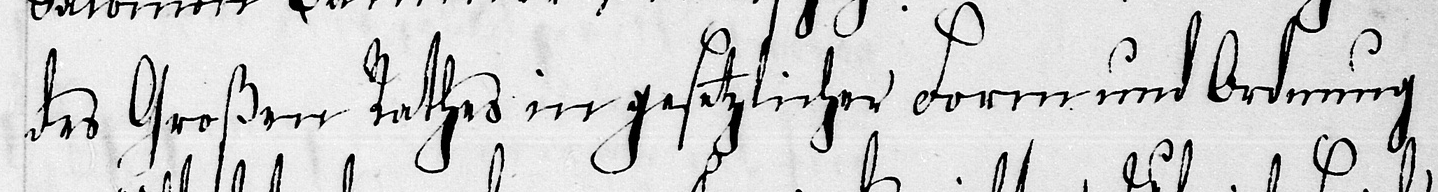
des Großen Rathes in gesetzlicher Form und Ordnung
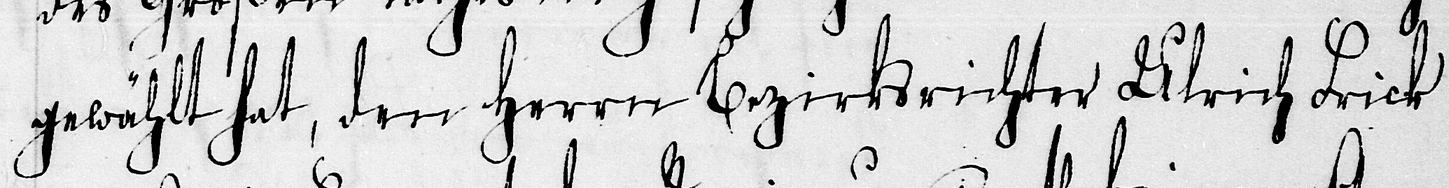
gewählt hat, den Herrn Bezirksrichter Ulrich Frick
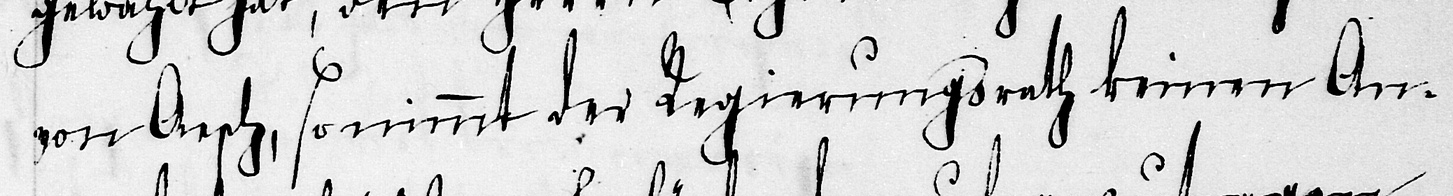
von Aesch, so nimmt der Regierungsrath keinen An¬
